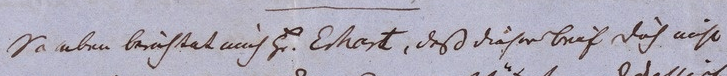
So eben berichtet auch Hr. Erhart, daß dieser Brief Dich nicht
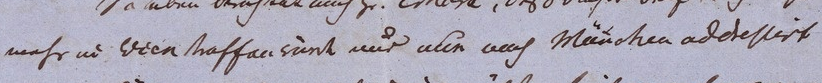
mehr in Wien treffen würde und nun nach München addressirt
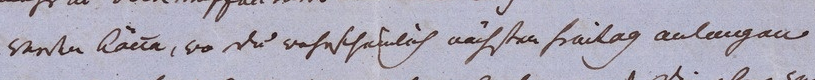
werden könne, wo Du wahrscheinlich nächsten Freitag anlangen
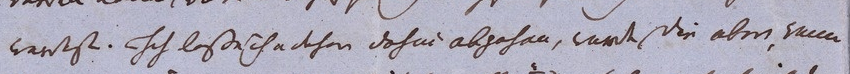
werdest. Ich laße ihn daher abgehen, werde Dir aber, wenn
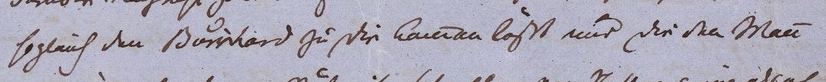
sogleich den Burkhard zu Dir kommen läßt und Dir den Mann
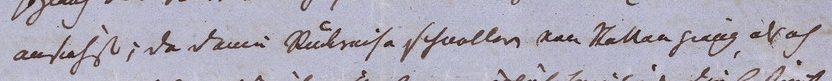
ansiehst; da Deine Rückreise schneller von Statten gieng, als ich
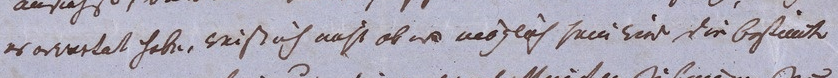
es erwartet habe, weiß ich nicht ob es möglich sein wird Dir bestimmte
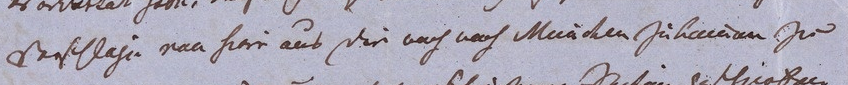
Vorschläge von hier aus Dir noch nach München zukommen zu
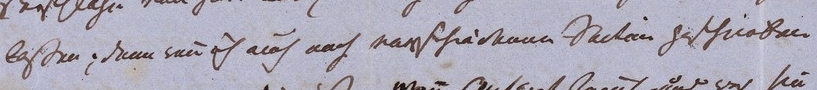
laßen; denn wenn ich auch nach verschiedener Seiten geschrieben
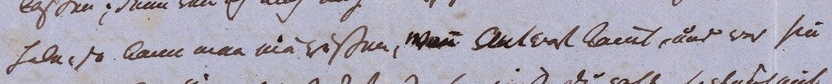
habe, so kann man nie wißen, wann Antwort kommt, und wer sie
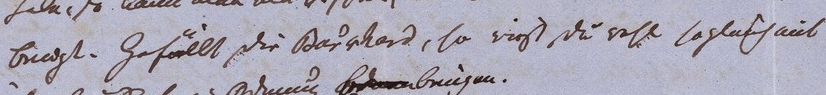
bringt. Gefällt Dir Burkard, so wirst Du wohl sogleich mit
